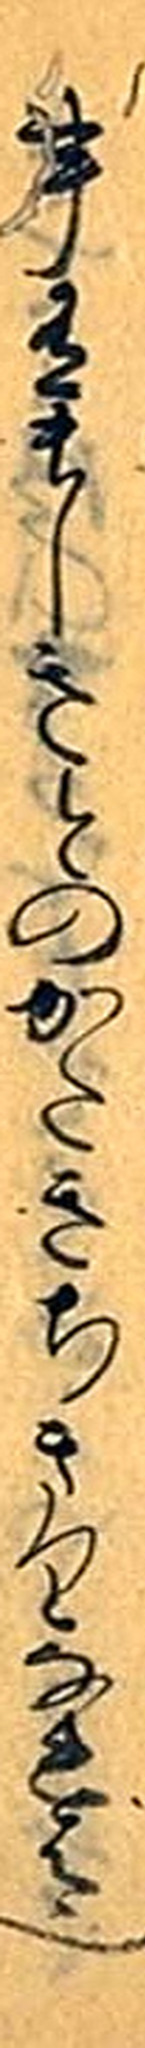事有ましきとのかたきちきりとなれは也
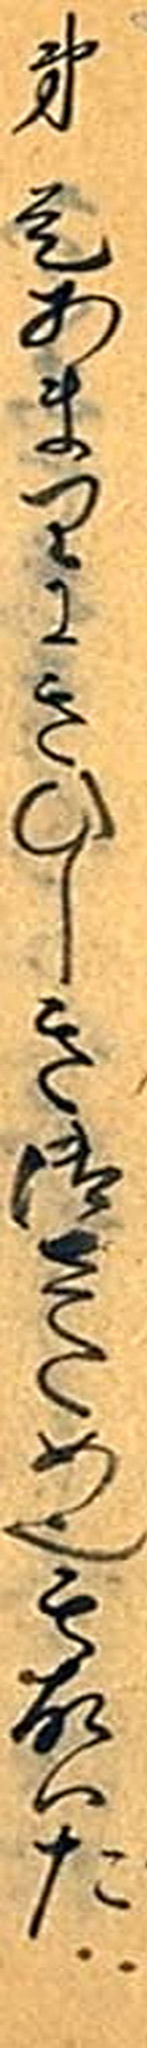弟是あまりにきひしき御さため也其故はた
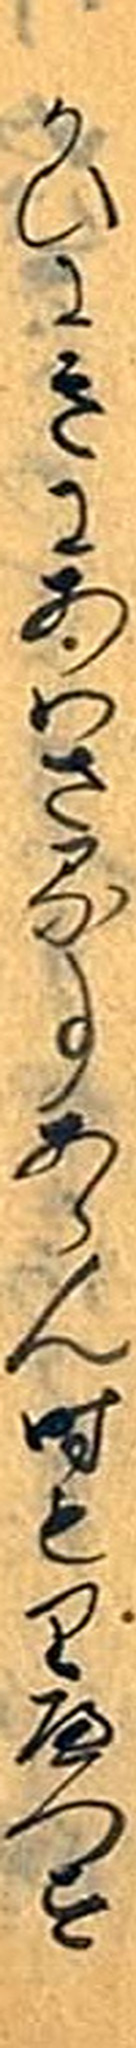かひにきにあはさる事あらん時もりへつす
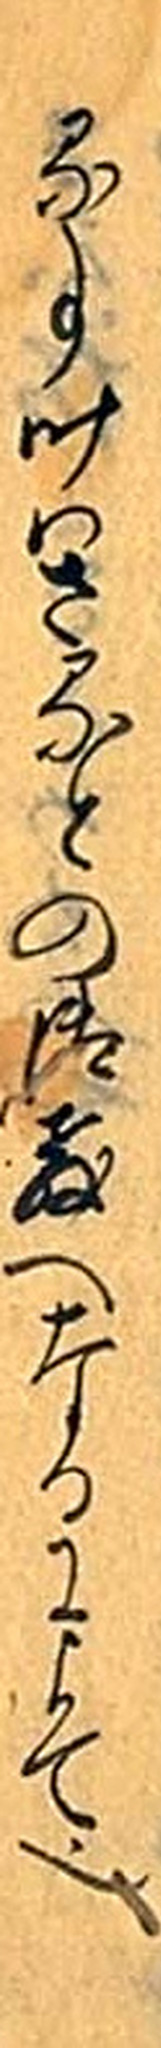る事叶はさるとの御教へなるによて也
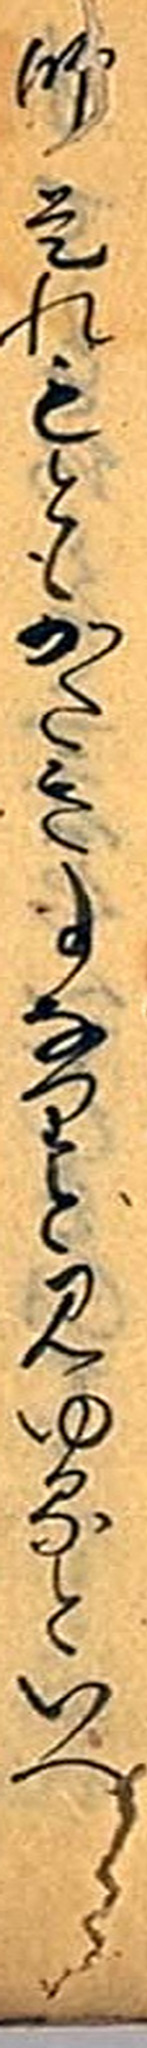師是れもともかたき事なりと見ゆるといへ
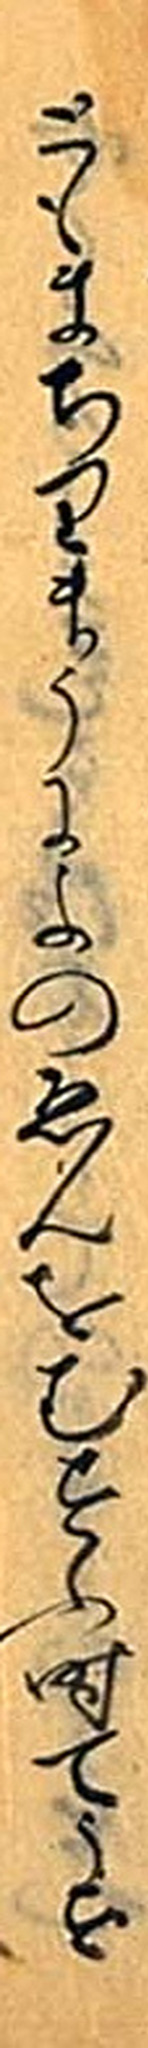ともまちりまうによのゑんをむすふ時てうす
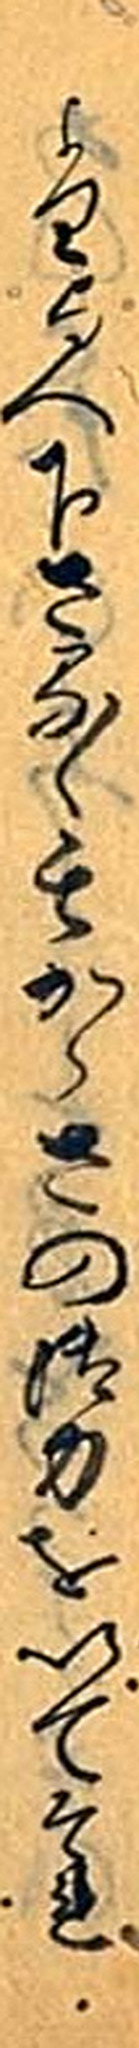より与へ下さるゝ其からさの御力を以てそれ
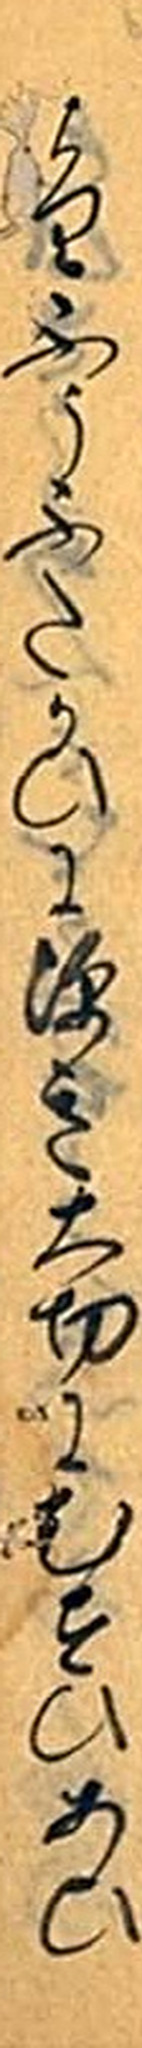よりふうふたかひに深き大切にむすひあひ
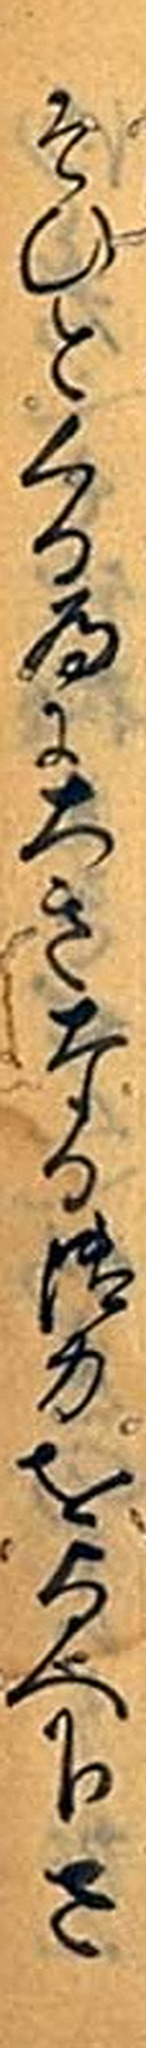そひとくる為に大きなる御力を与へ下さ

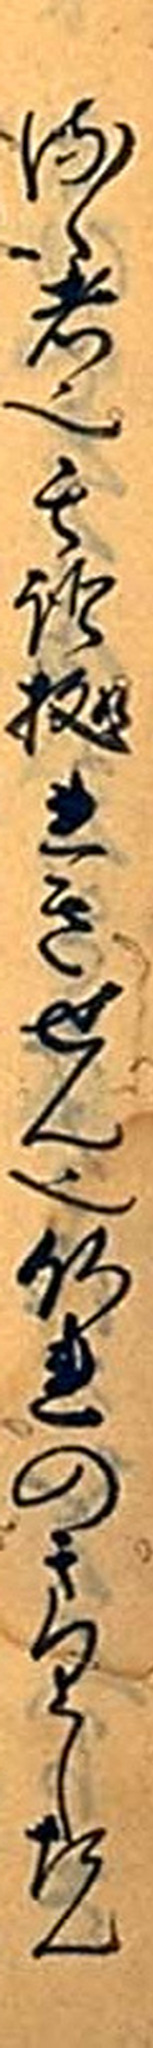るゝ者也其証拠れきせん也何れのきりしたん
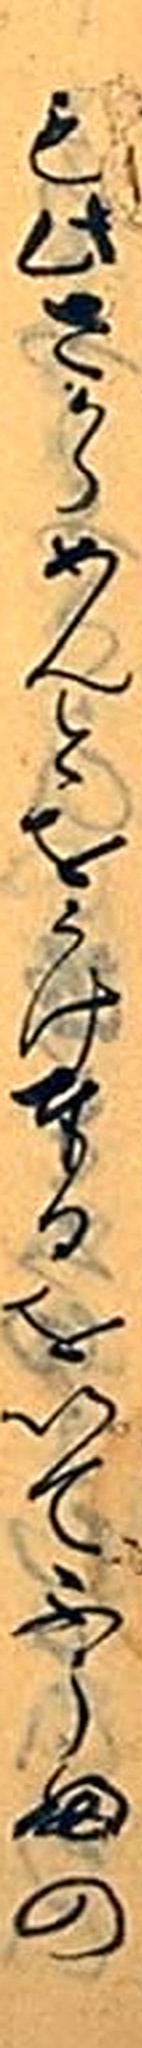も此さからめんとをうけ奉るを以てふう婦の
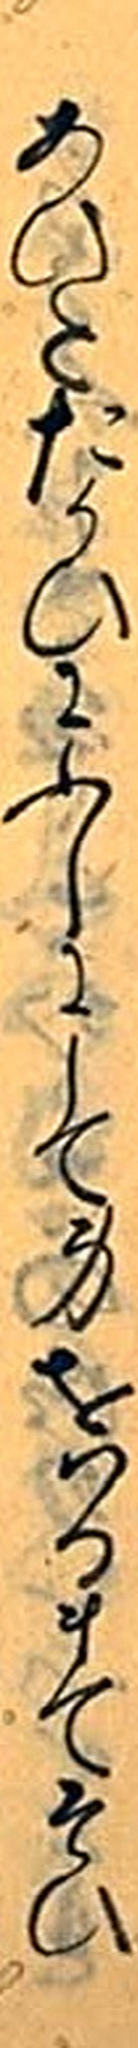あひとたかひにふしにして身をはるまてそひ
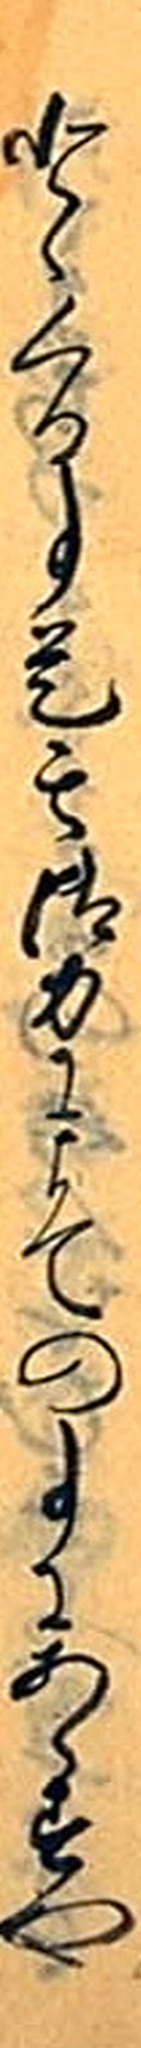とゝくる事是其御力によての事にあらすや
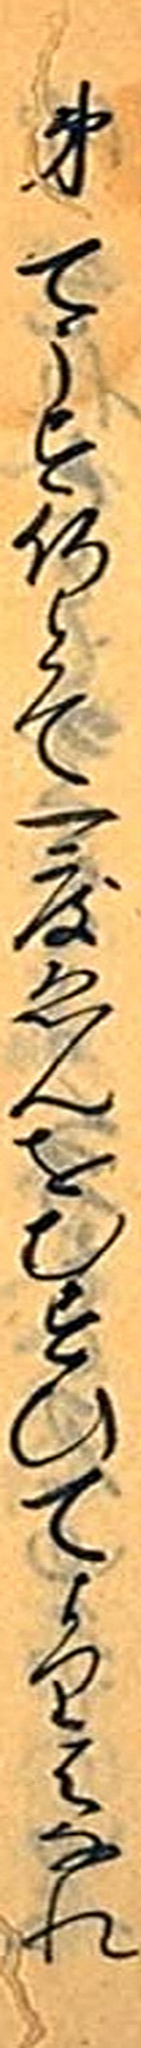弟てうす何とて一度ゑんをむすひてよりはなれ
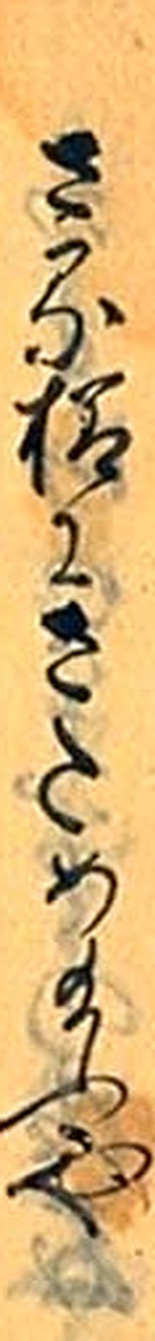さる様にさため給ふや
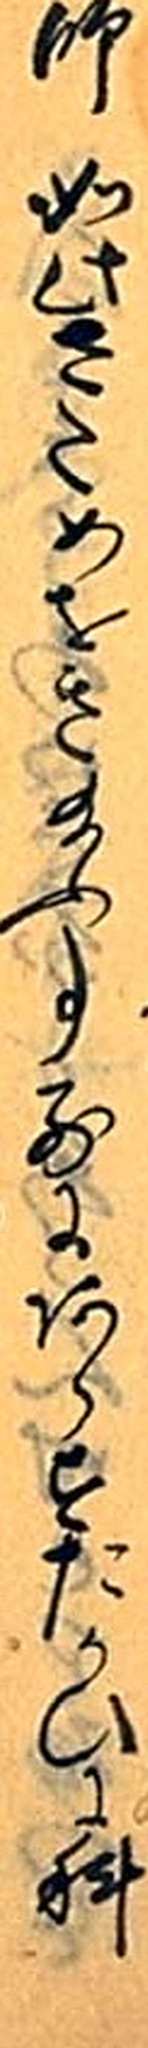師如此さためをき給ふ事別にあらすたかひに科
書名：ドチリナ・キリシタン
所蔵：東京大学総合図書館 / General Library in the University of Tokyo
